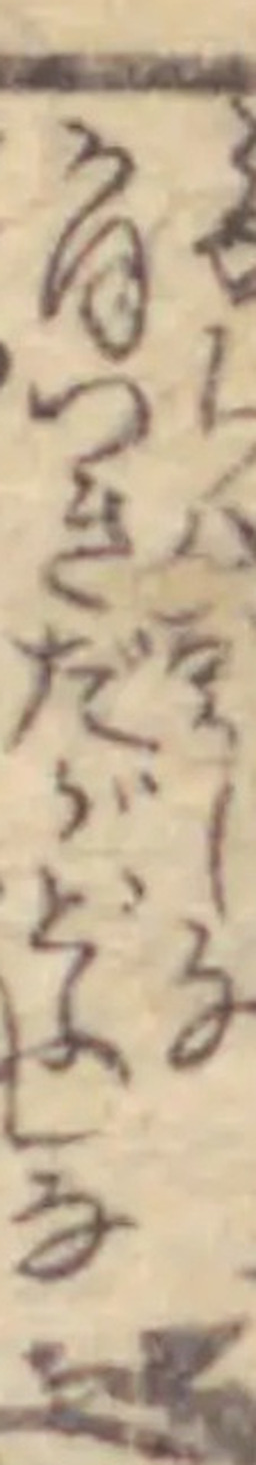かほつきだがどふしな
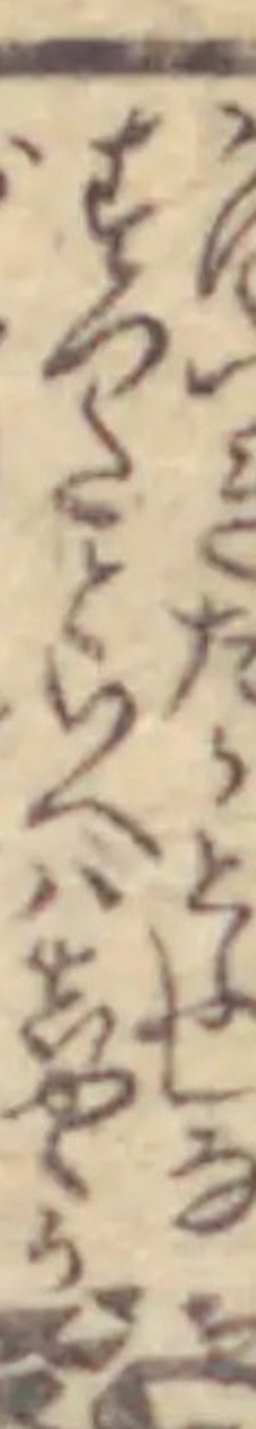すつたといへはしやくか
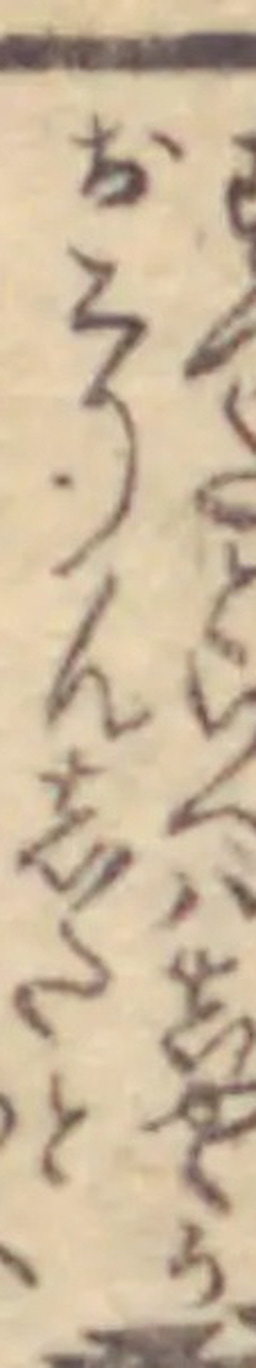おこりんしたと
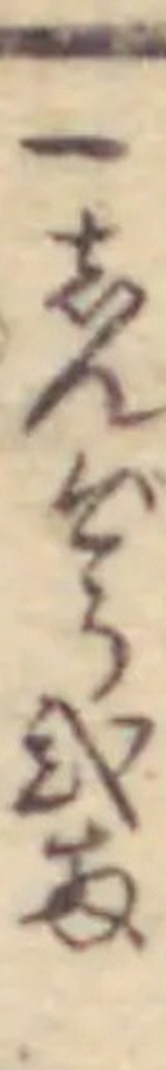一しんぞう弐両
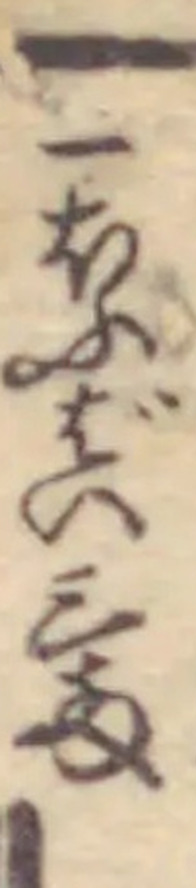一ほふばい三両
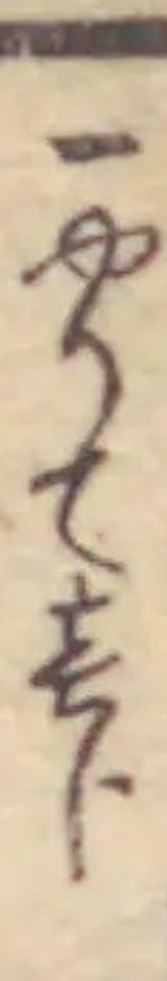一やりて一分
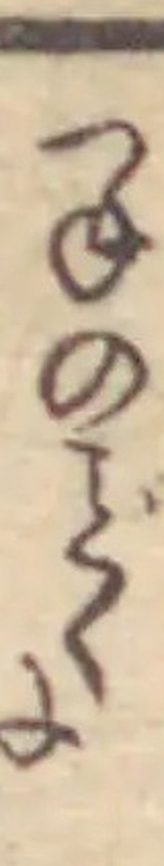つねのごとくに
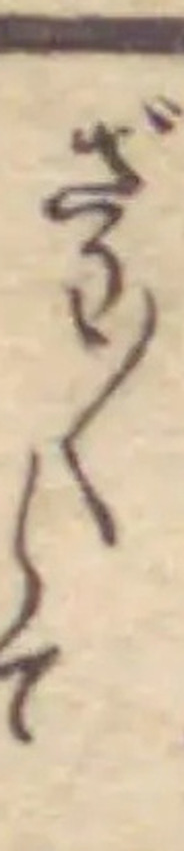ざわ〳〵して
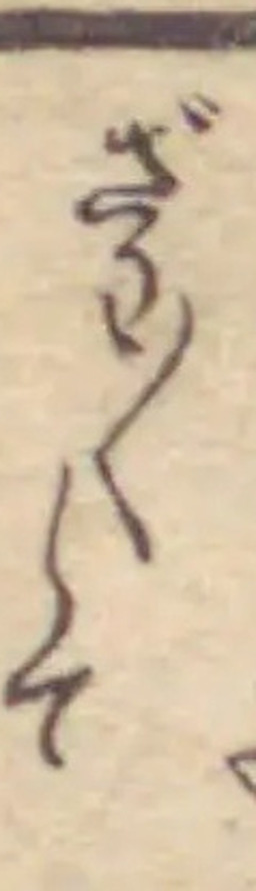ざわ〳〵して
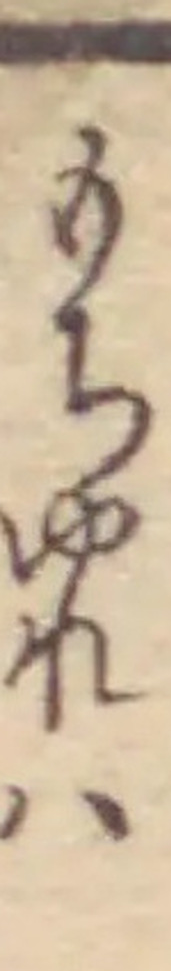もちゆれは
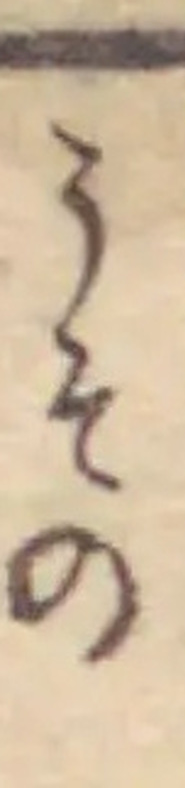うその
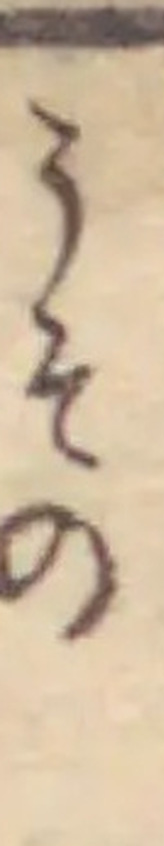うその
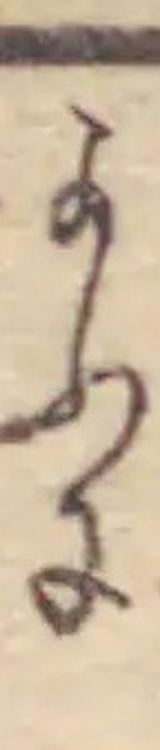よふに

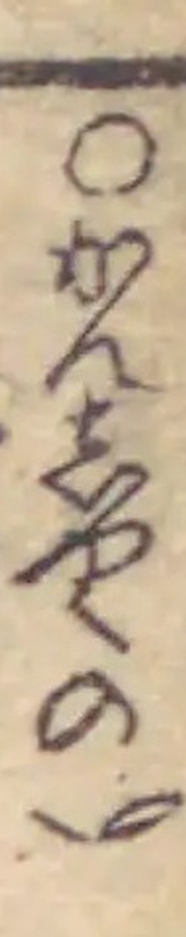〇かんしやくの
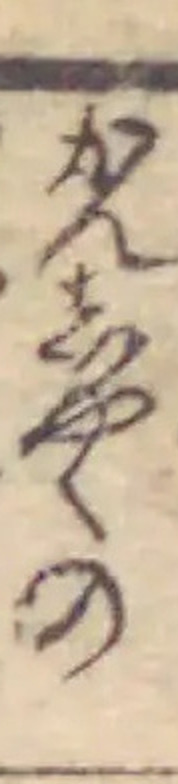かんしやくの
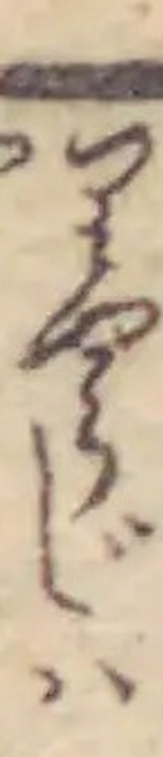りやうじは
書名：家伝寿命薬 2巻
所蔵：国立国会図書館 National Diet Library, JAPAN
